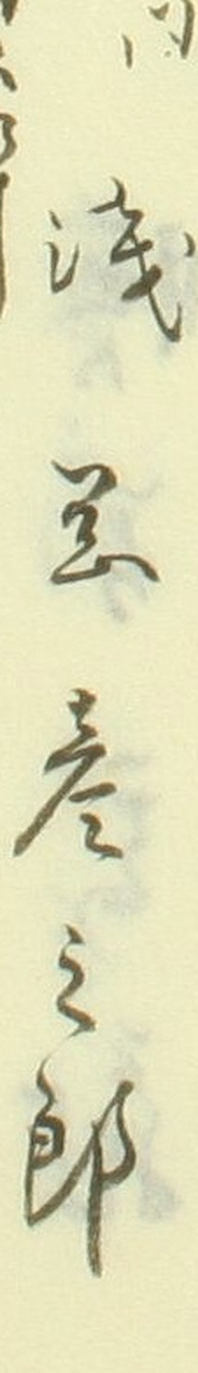浅岡彦三郎
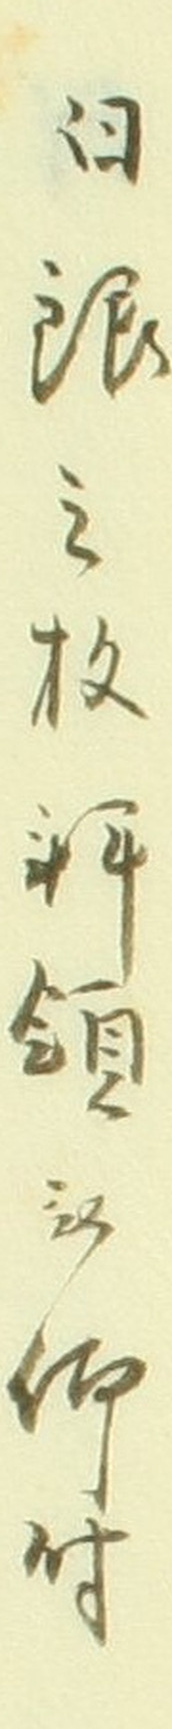白銀五枚拝領被仰付同
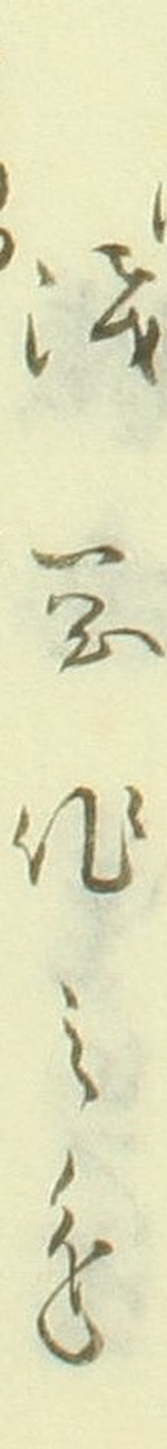浅岡作之進
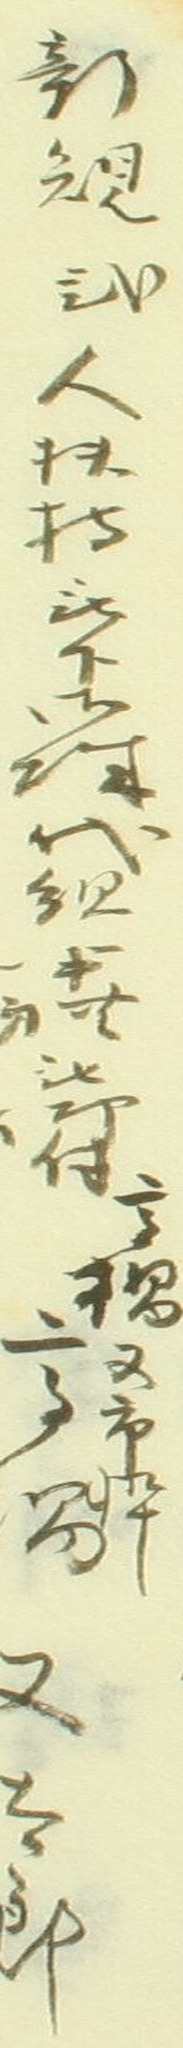新規弐人？持被下御誠代組半礼被仰付高橋又市倅
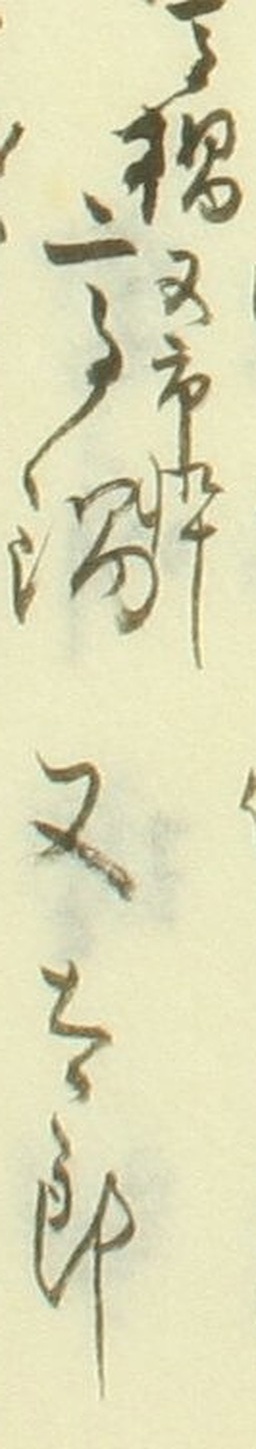高橋又太郎
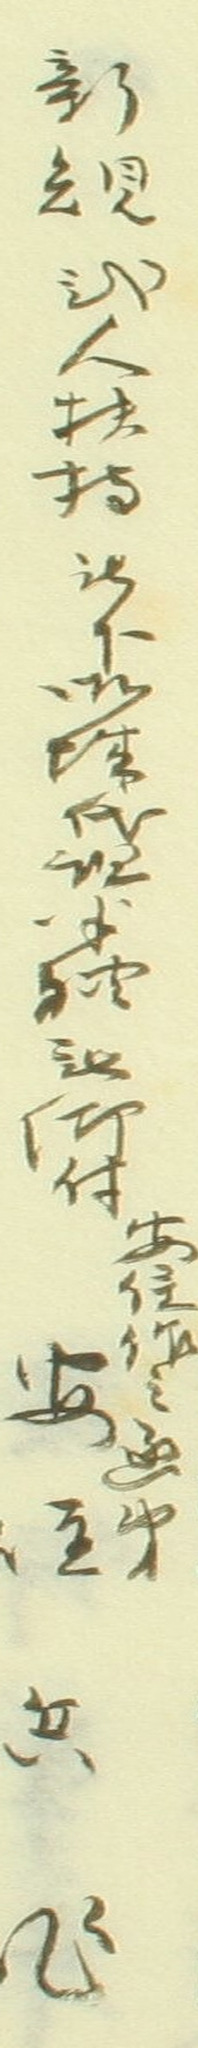新規弐人扶持被下御誠代組被仰付安住作之丞弟
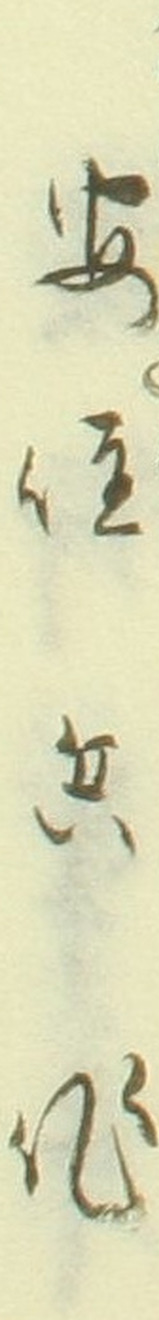安住兵作
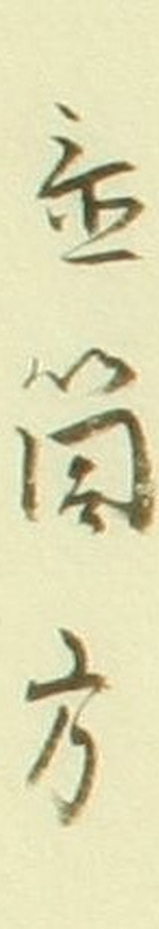置筒方

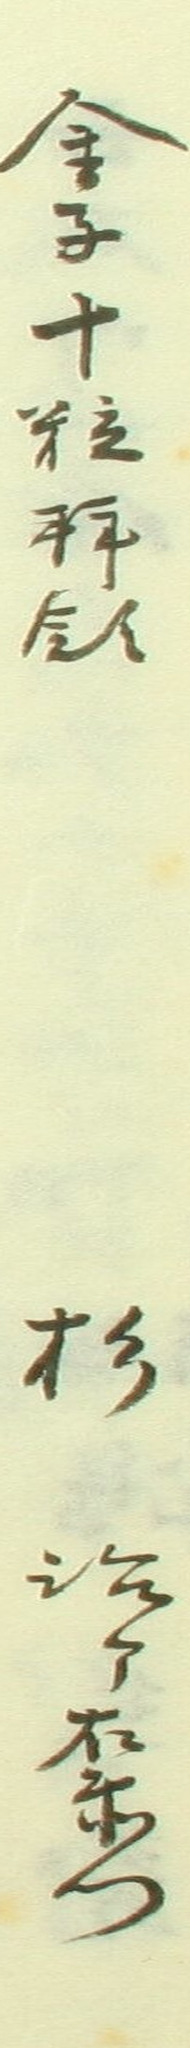金子十粒拝領杉治了右衛門
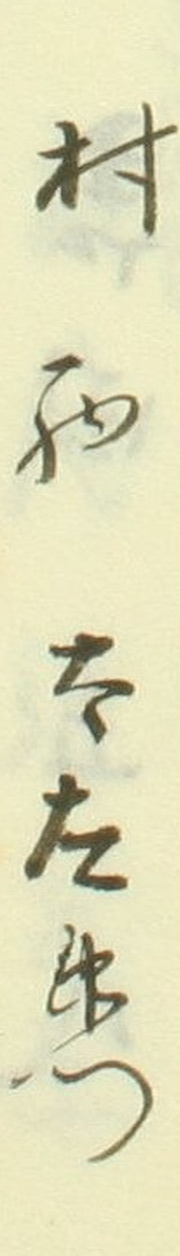同村西太左衛門

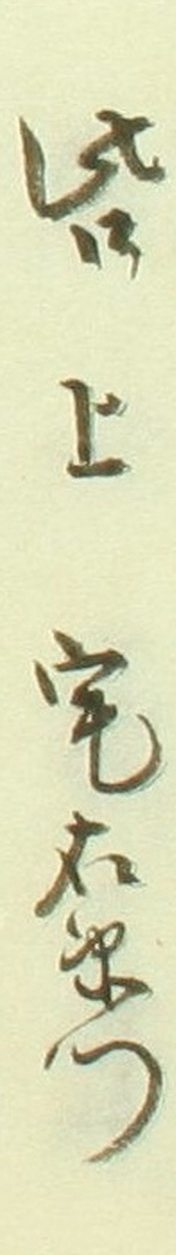同？上宅右衛門
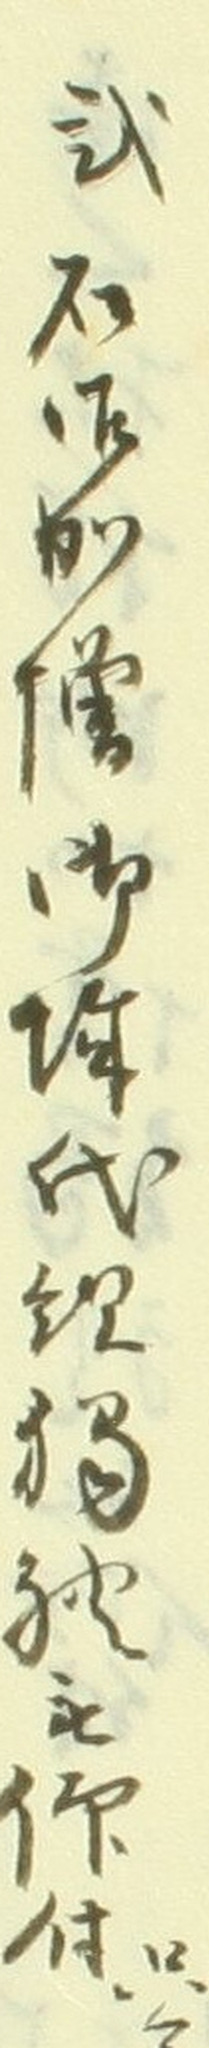壱石御加増御城代組半礼被仰付同
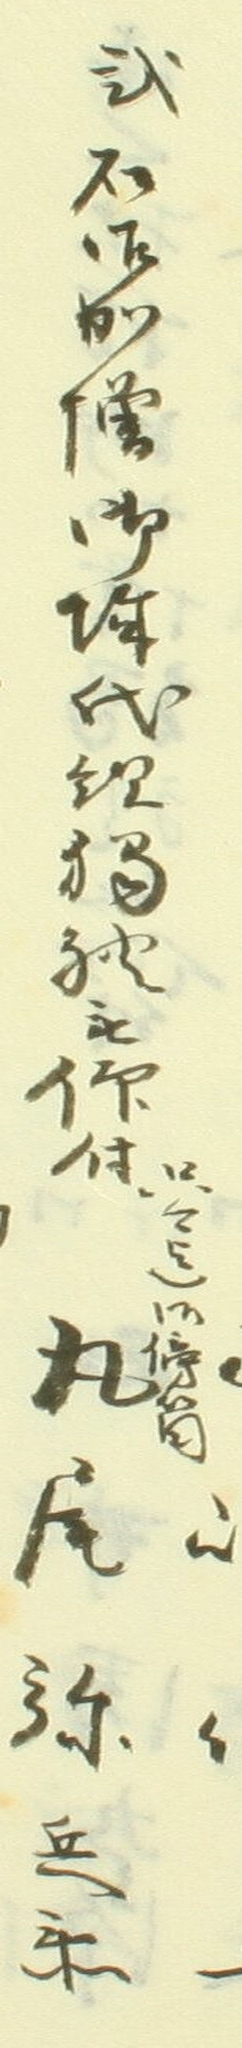壱石御加増御城代組半礼被仰付同
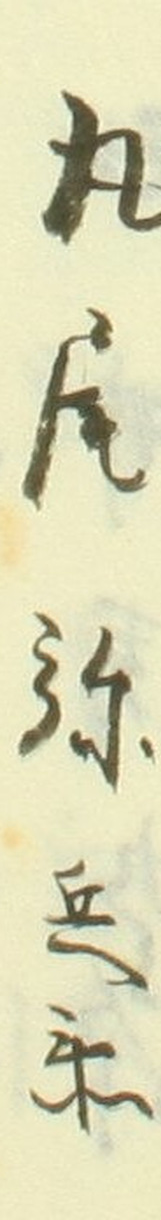丸尾弥兵衛
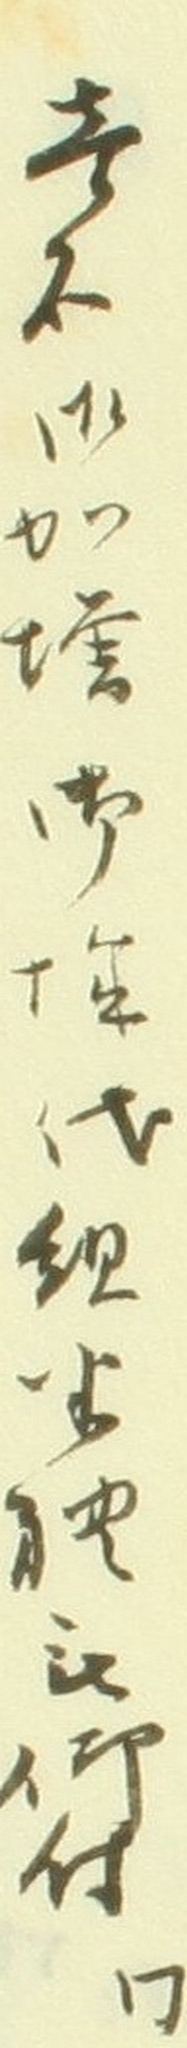壱石御加増御城代組半礼被仰付同
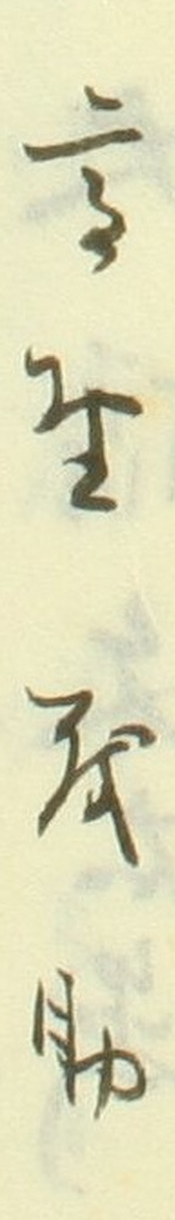高野茂助
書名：唐船漂流記 三
